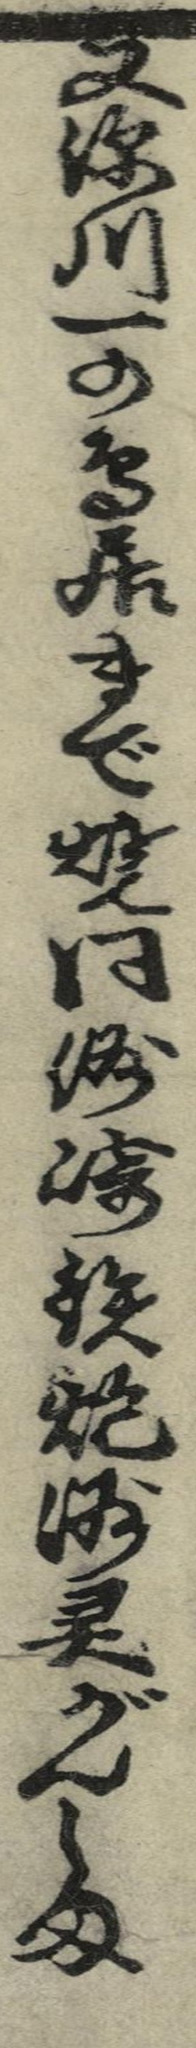又深川一の鳥居まで焼同洲崎鉄砲洲霊がんしま
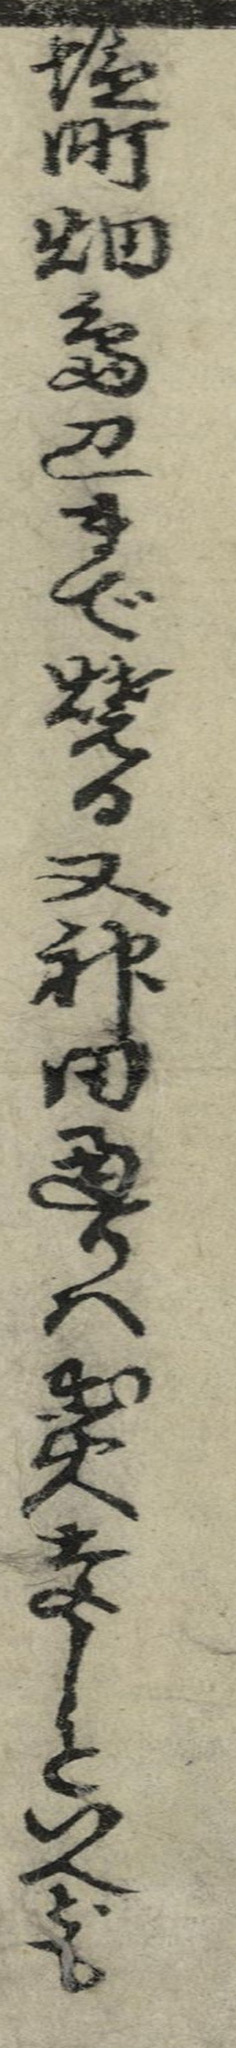塩町畑嶋辺まで焼る又神田通りは出火なしといへども
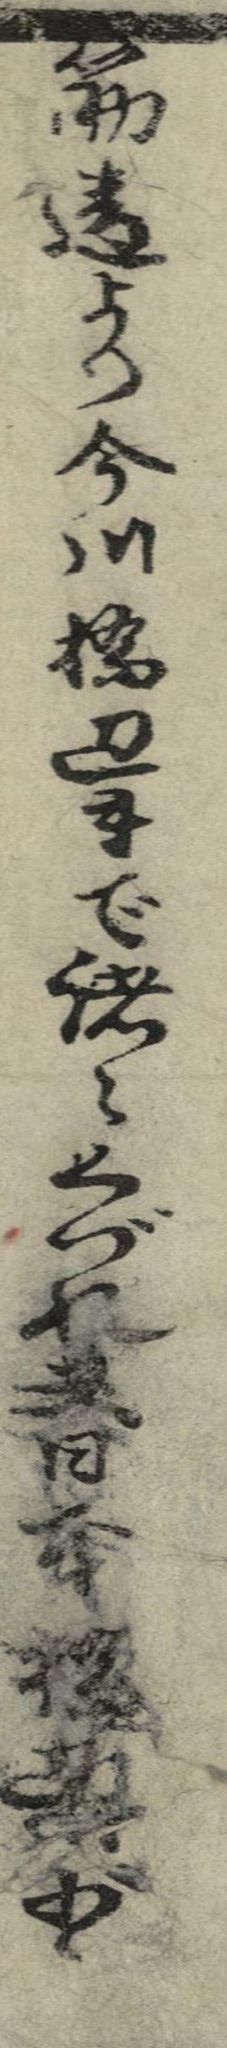筋違より今川橋辺まで諸〻くづれ又日本橋辺少ゝ
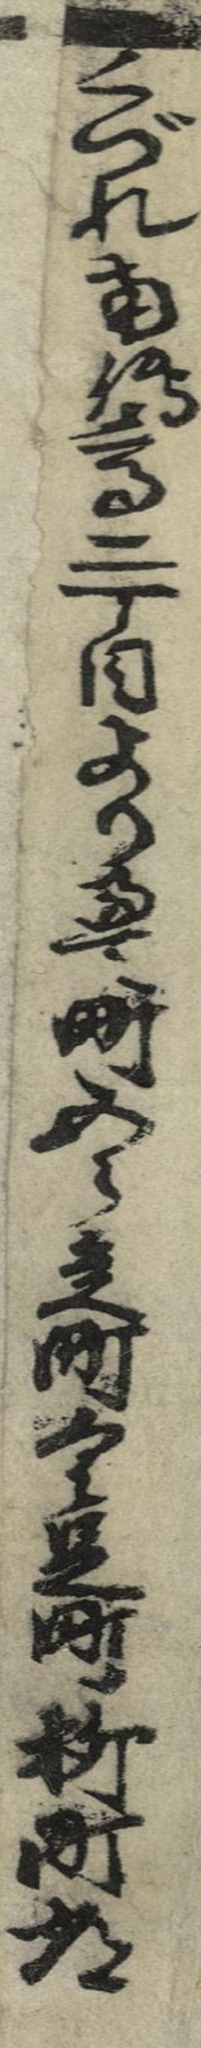くづれ南伝寺二丁目より畳町五郎兵へ町具足町柳町常
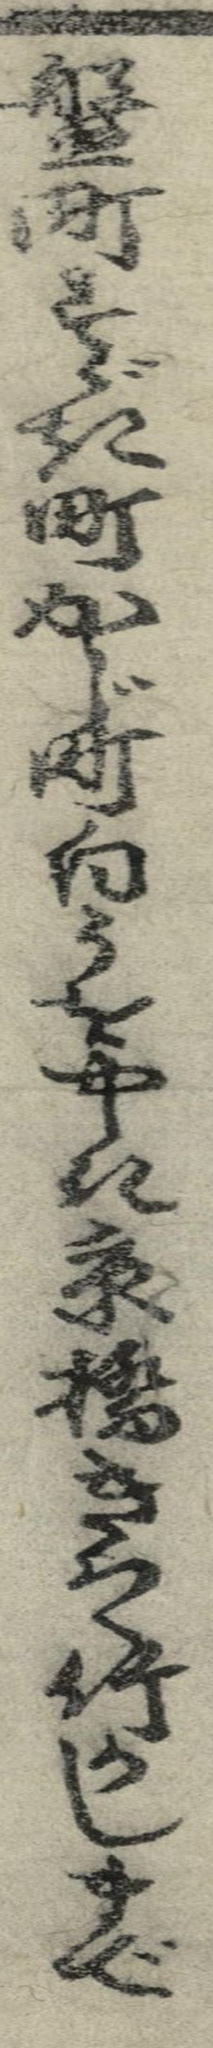盤町すゞき町かじ町向うをやしき京橋きつゝ竹かしまで
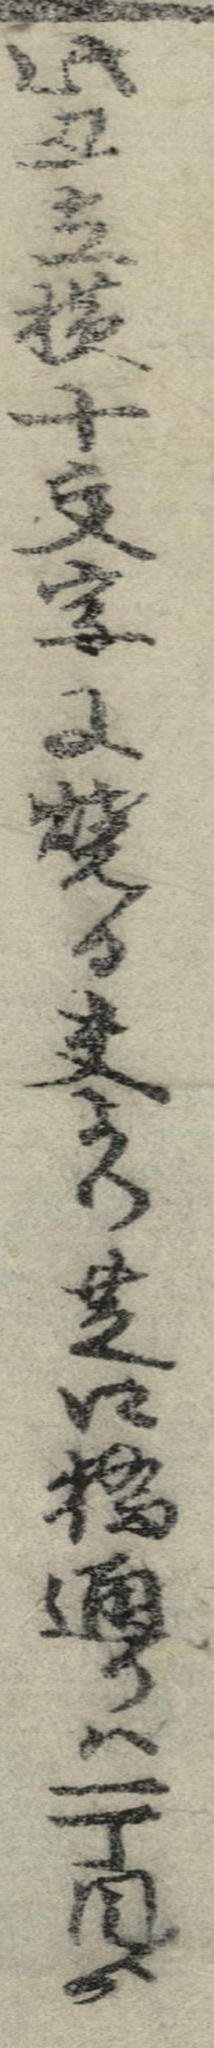此辺立横十文字に焼る夫より芝口橋通りは一丁目ゟ
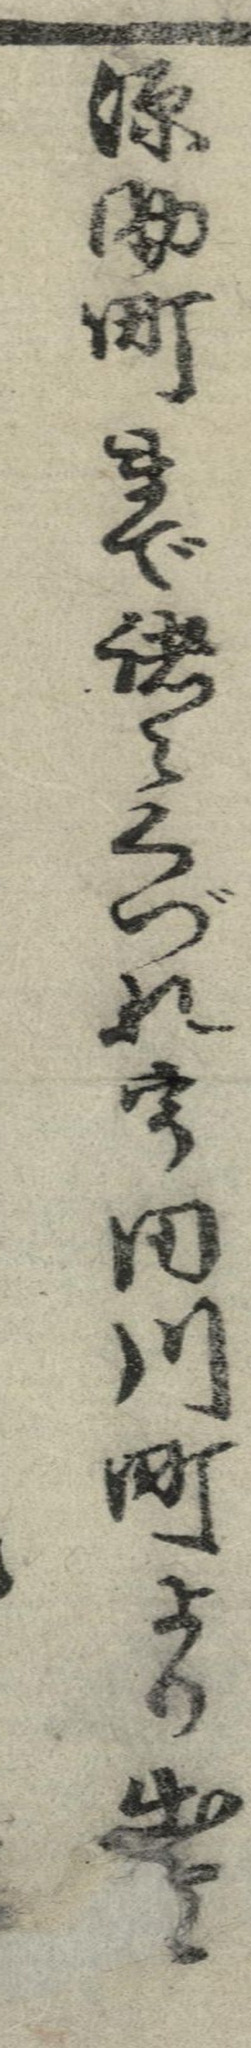源助町まで諸〻くづれ宇田川町より出火
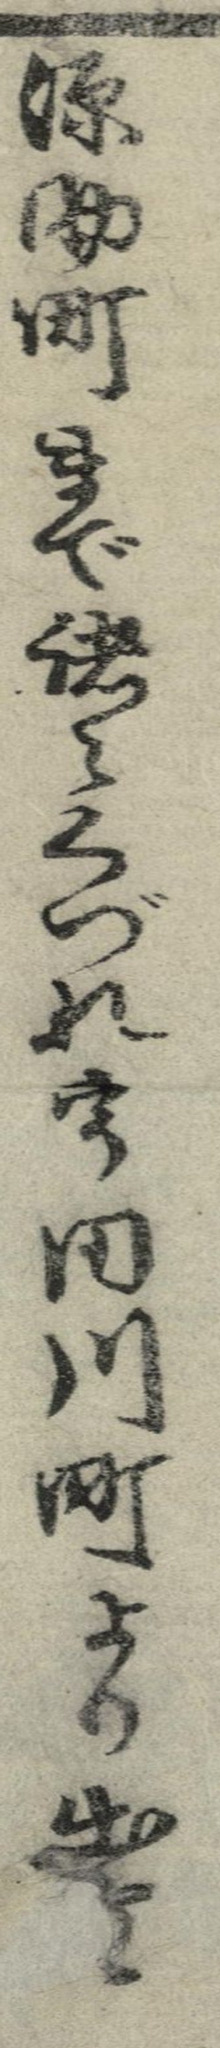源助町まで諸〻くづれ宇田川町より出火
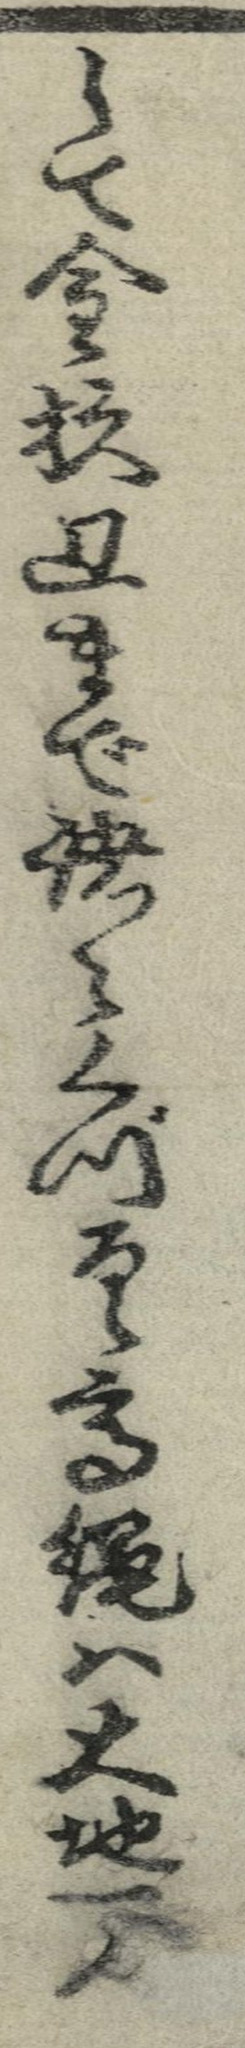して金杉辺まで諸〻くづるゝ高縄は大地一尺？
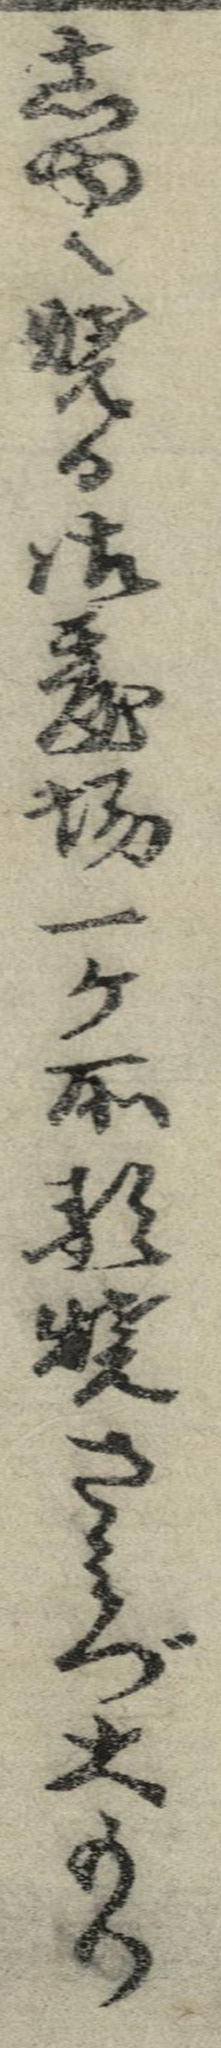しゆ智く焼る御台場一ヶ所類焼さみづ大もり
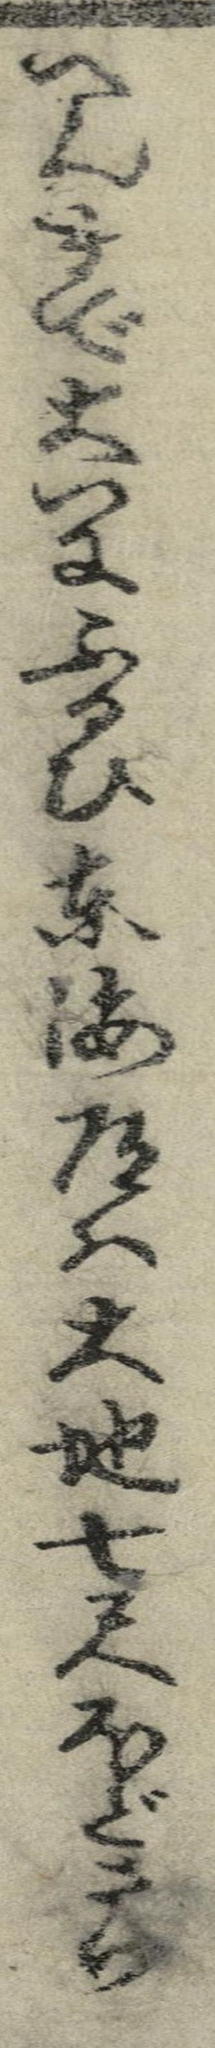へんまで大いにふるひ東海道は大地七尺ほどさけ
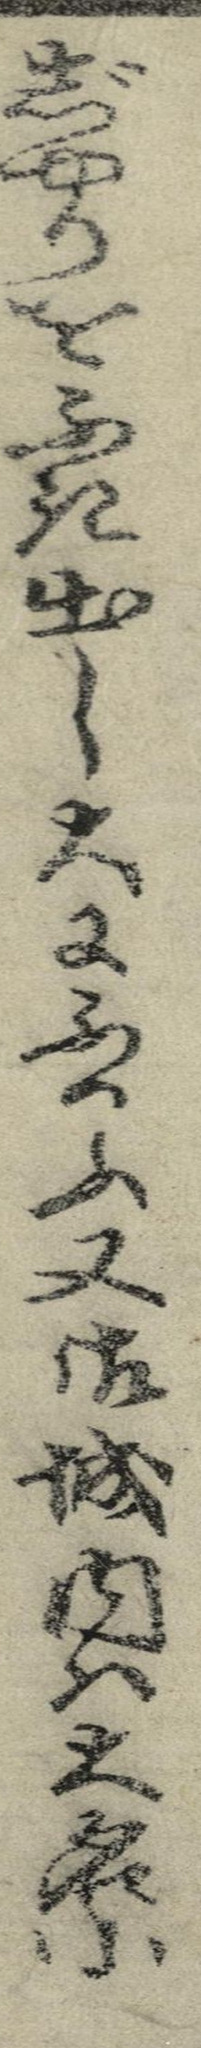じやりをふき出し大にふるふ又御城内は大名小
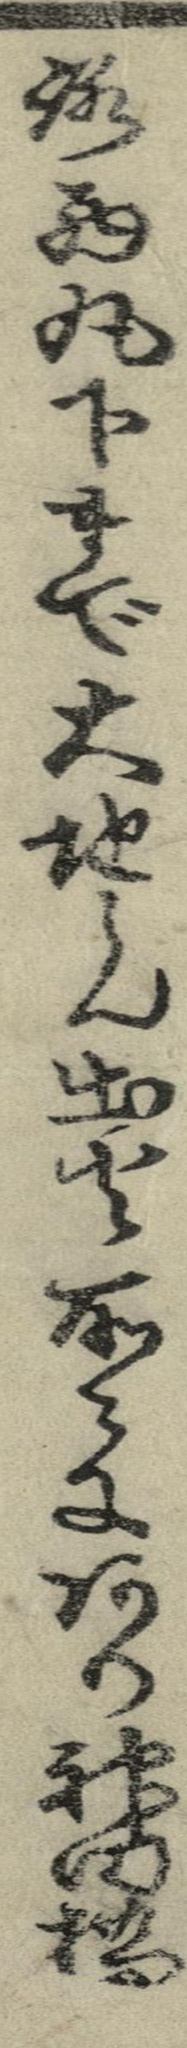路西丸下まで大地しん出火所〻にあり神田橋
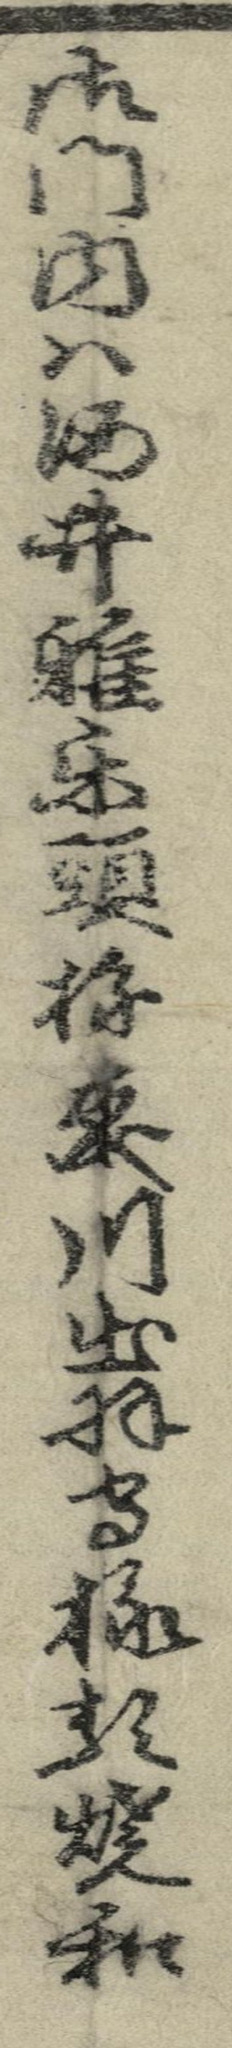御門内は酒井雅楽頭様森川出羽守様類焼和
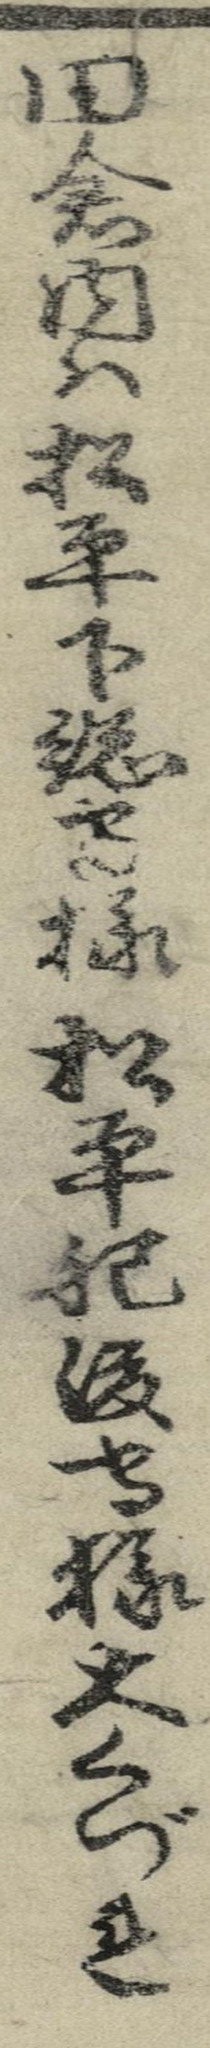田倉内は松平下総守様松平肥後守様大くづれ
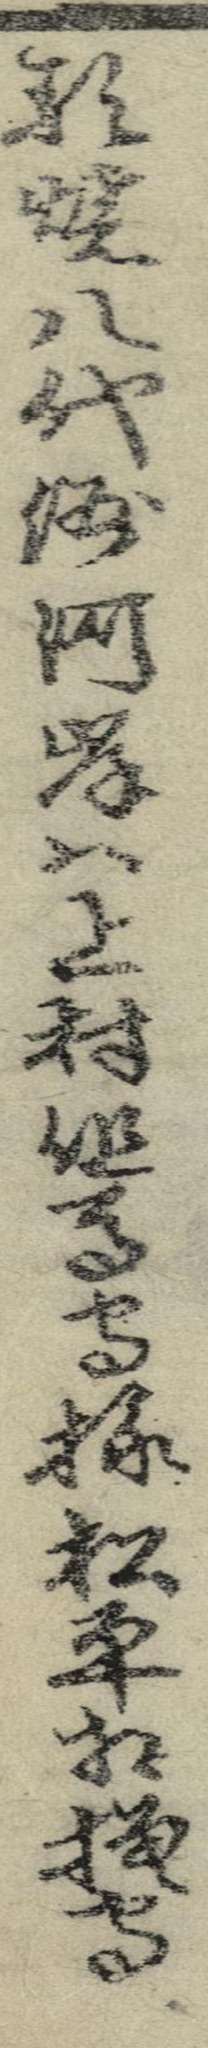類焼八代洲河岸ハ上村但馬守様松平相模守浅草
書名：江戸大地震并出火場所極本しらべ
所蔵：東京大学地震研究所図書室 Earthquake Research Institute Library, The University of Tokyo, JAPAN
